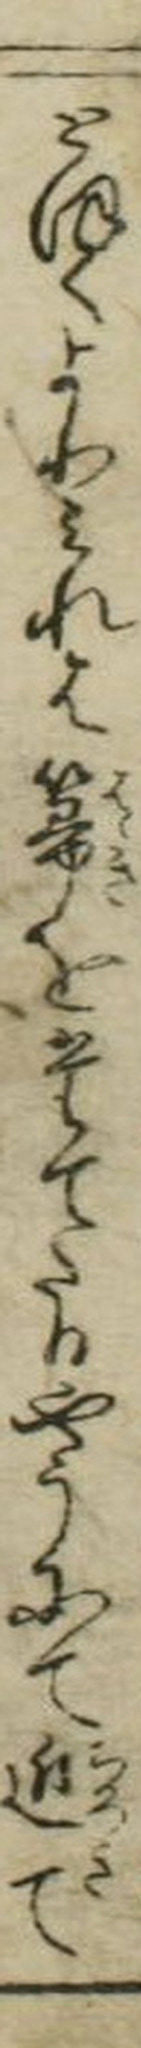とほくよりみれは箒をたてたるやうにて近て
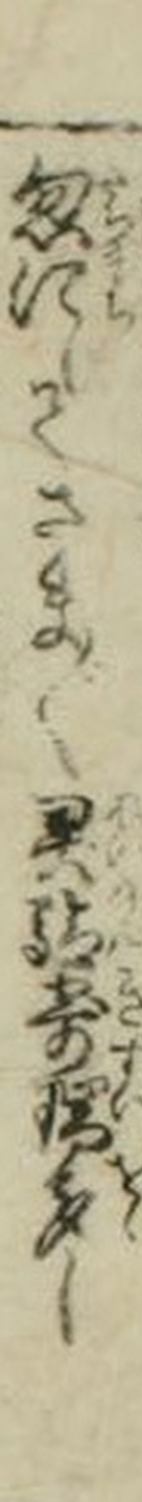忽にしてさま〴〵霊験奇瑞多し
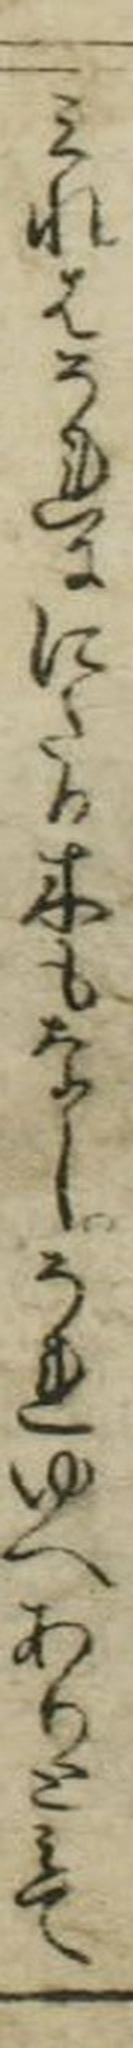みれはそれににたる木もなし。それゆへありとみて
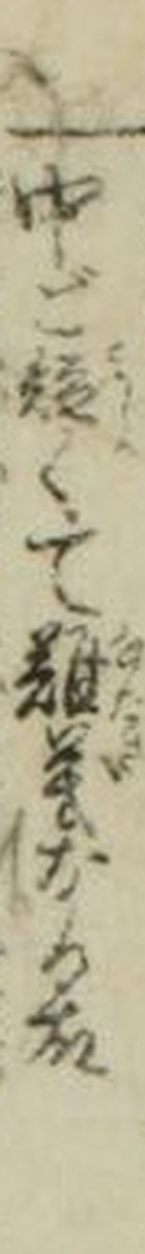中ご短くて難義なる故
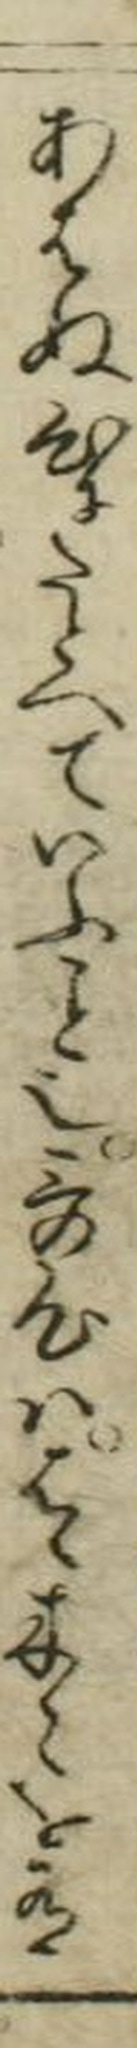あはぬ心にたとへていふこと也。哥心は。はゝ木々を有
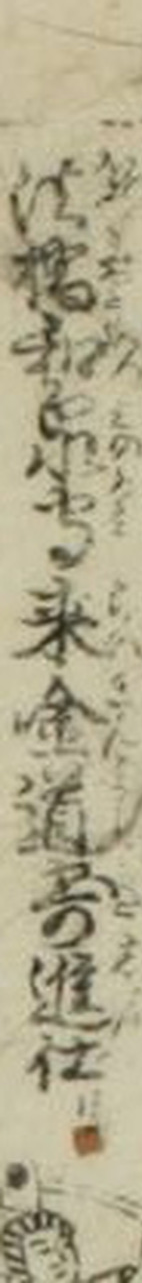法橋和泉守来金道寄進仕リ
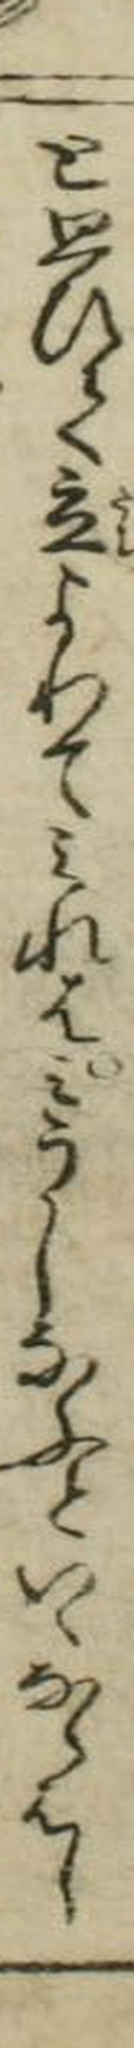と思ひて立よりてみれは。みうしなふといゝならはし
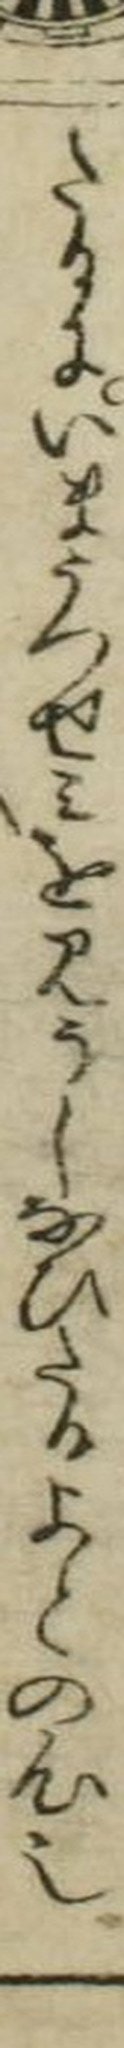たるに。いまうつせみを見うしなひたるよとの心也。
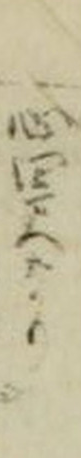心四尺なり
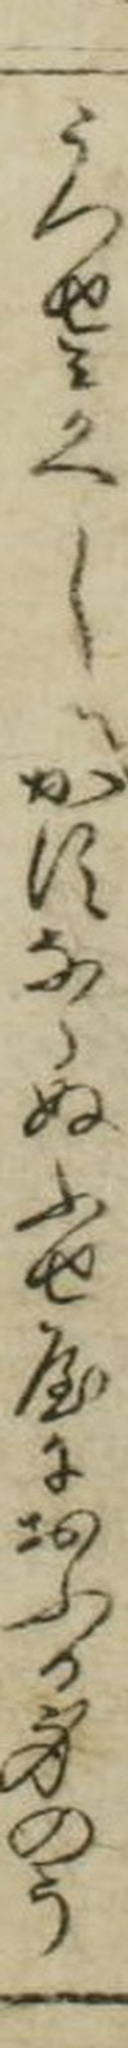うつせみかへし〽かすならぬふせ屋におふる身のう
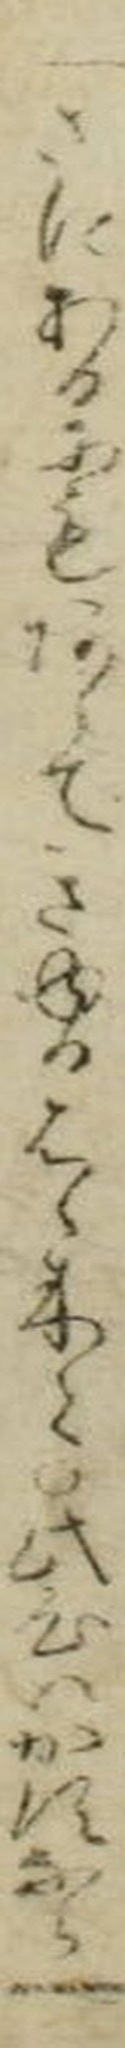さにあるにもあらできゆるはゝ木々〇此心はかすなら
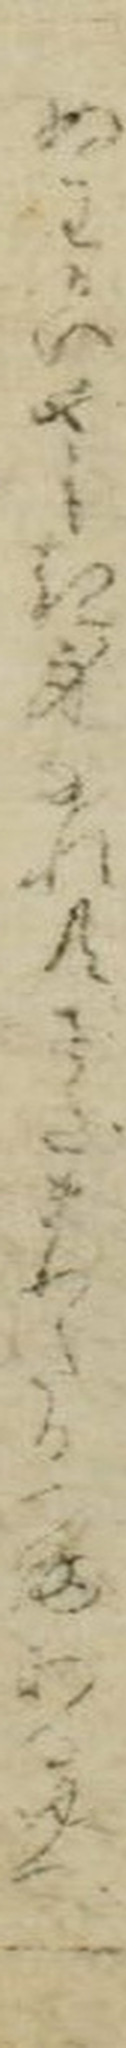ぬわかいやしき身なれ共。さだまりたるつまあるゆへ。
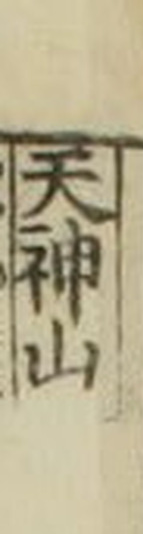天神山
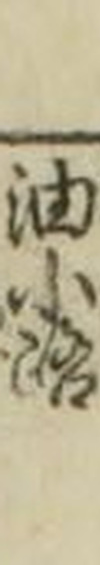油小路
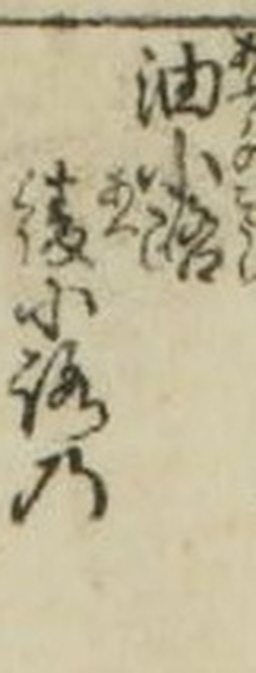綾小路の
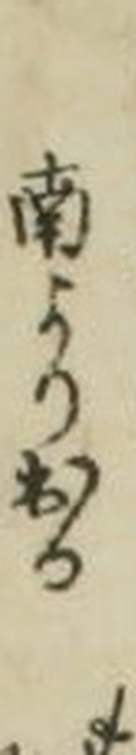南より出る
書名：女源氏教訓鑑
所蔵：東京学芸大学附属図書館
